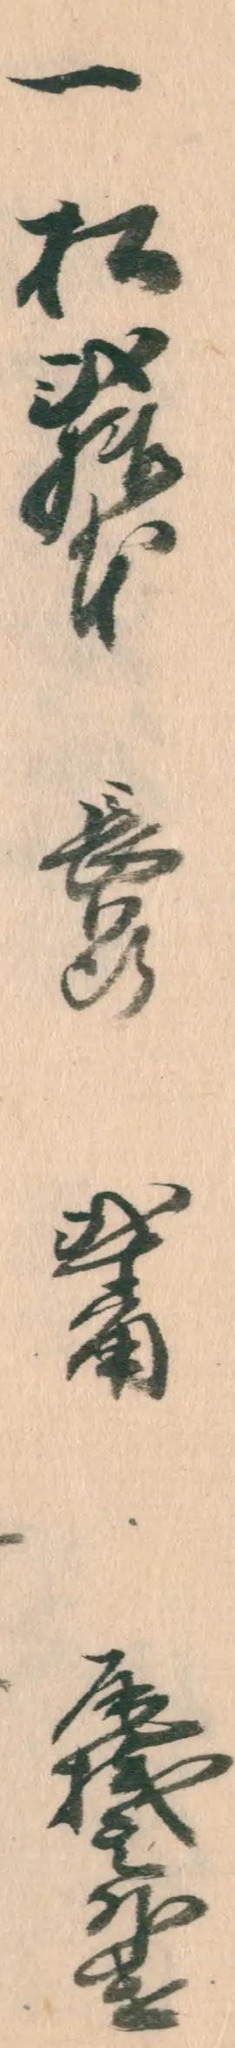一松弐拾本長同断弐寸角瓦桟其外遣
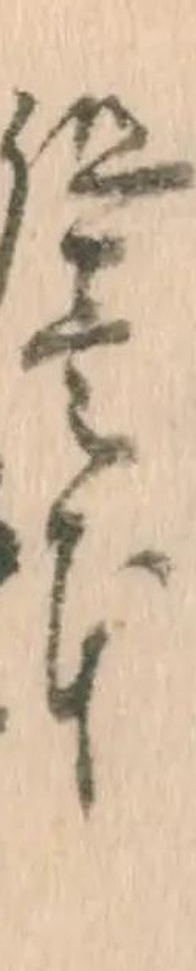但壱本
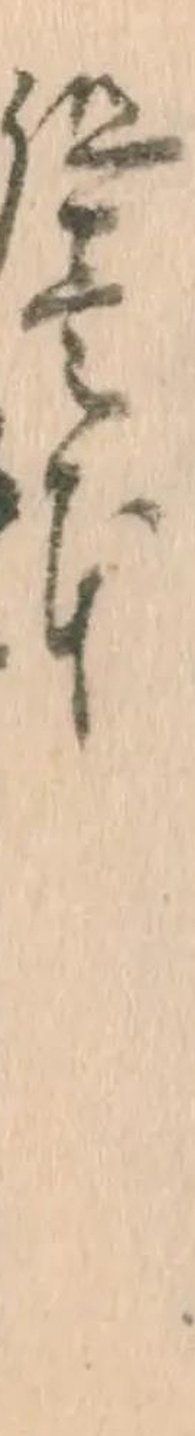但壱本
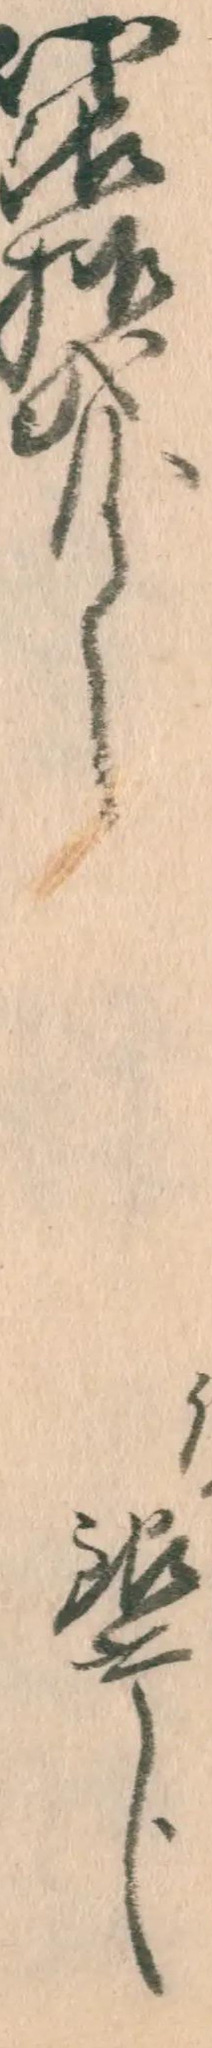代銀拾弐匁銀六分
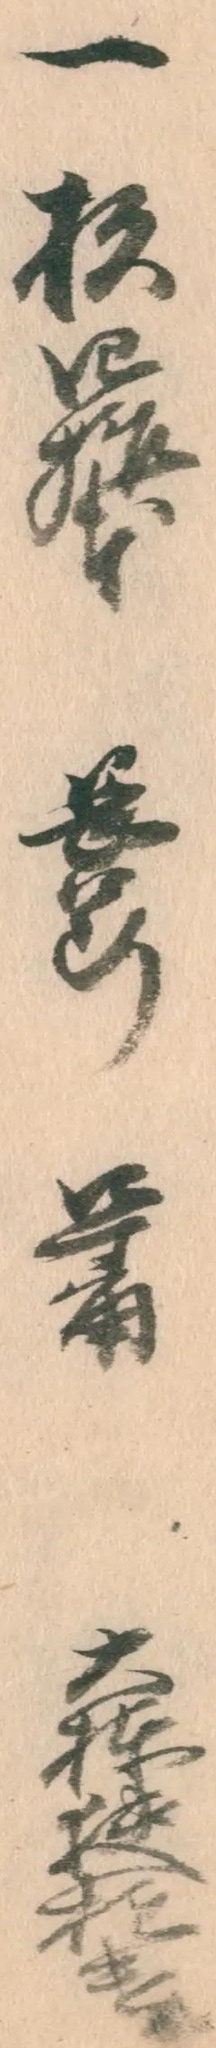一杉四拾本長同断四寸角大棟梜柱遣

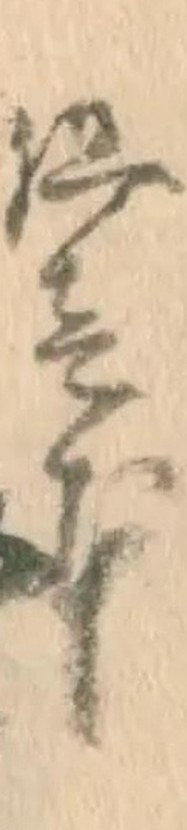但壱本
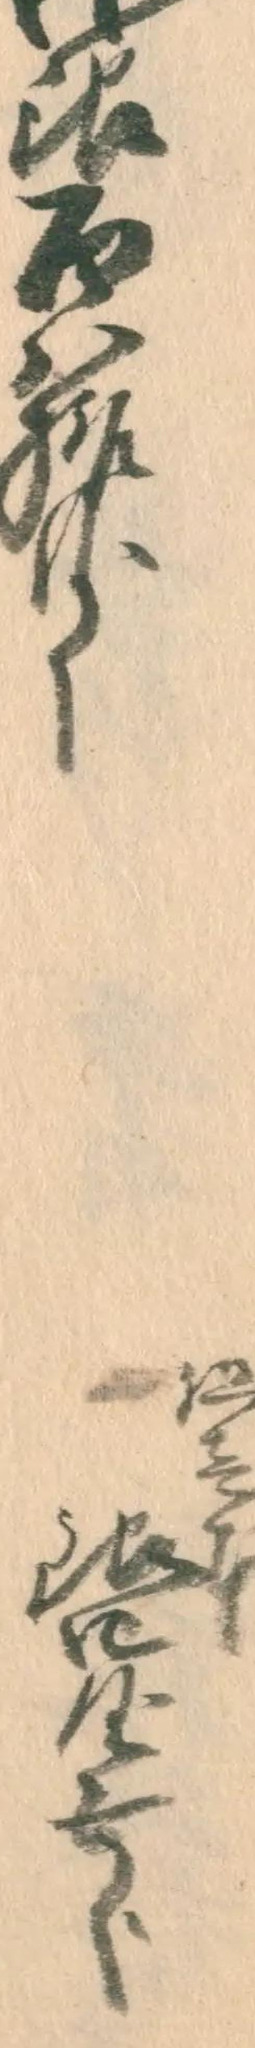代銀百八拾匁銀四匁五分
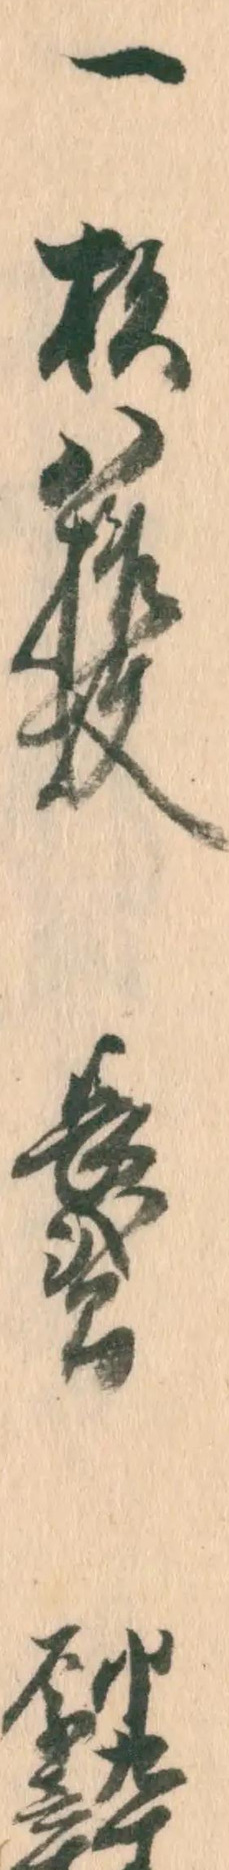一杉八拾枚長弐間巾九寸
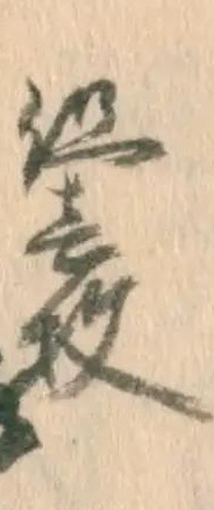但壱枚
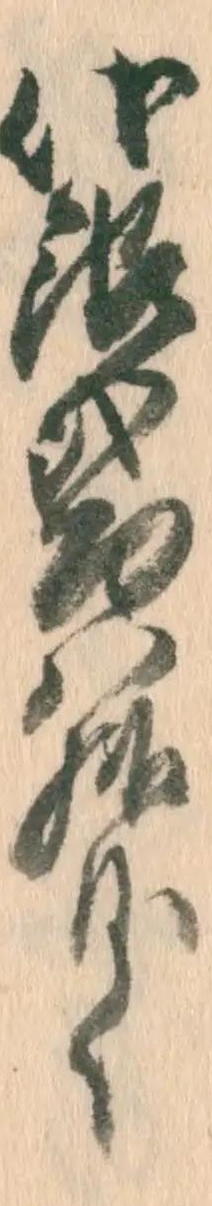代銀弐百八拾匁銀三匁五分
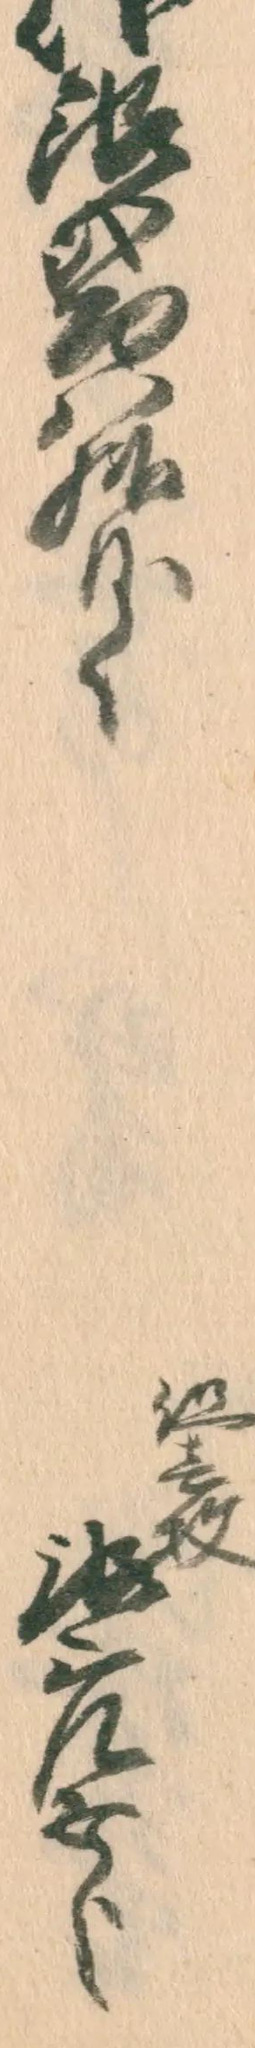代銀弐百八拾匁銀三匁五分
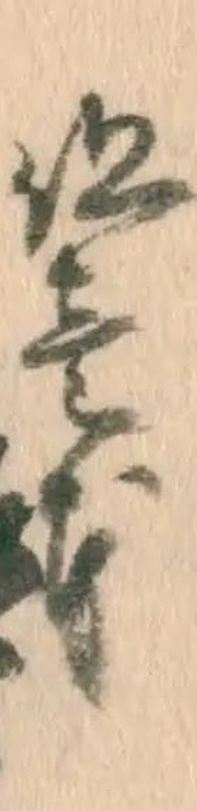但壱本
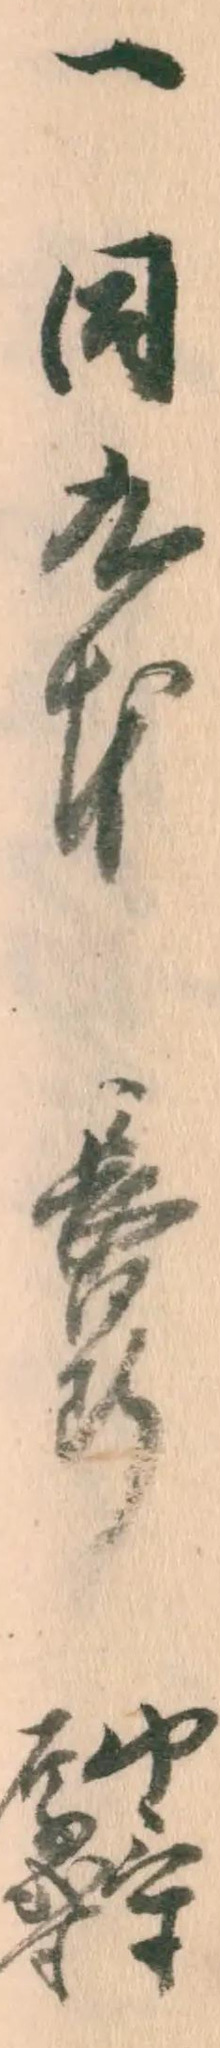一同九本長同断巾三寸
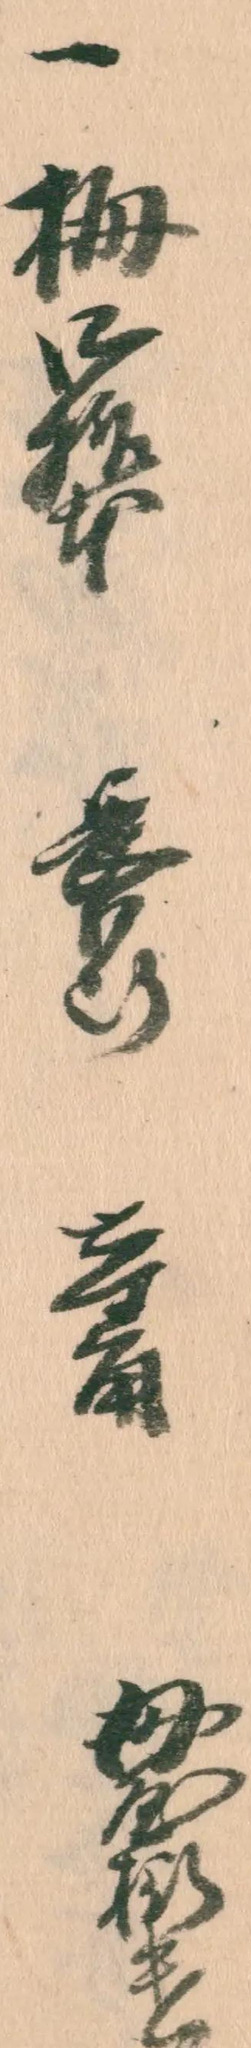一栂四拾本長同断六寸角母屋桁遣
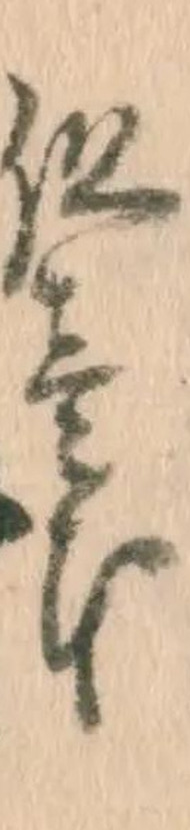但壱本
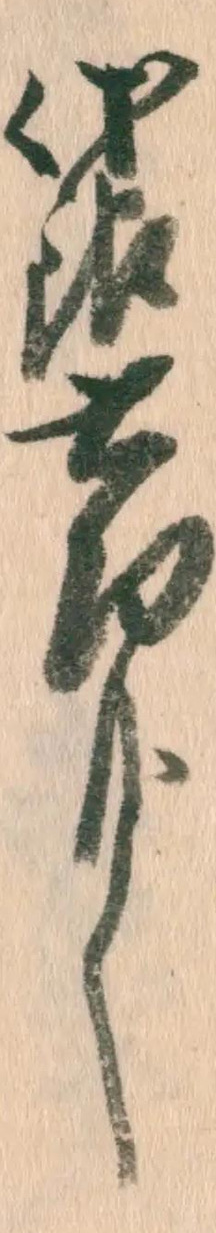代銀六百匁銀拾五匁
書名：三十三間堂. [1]
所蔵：国立国会図書館 National Diet Library, JAPAN
